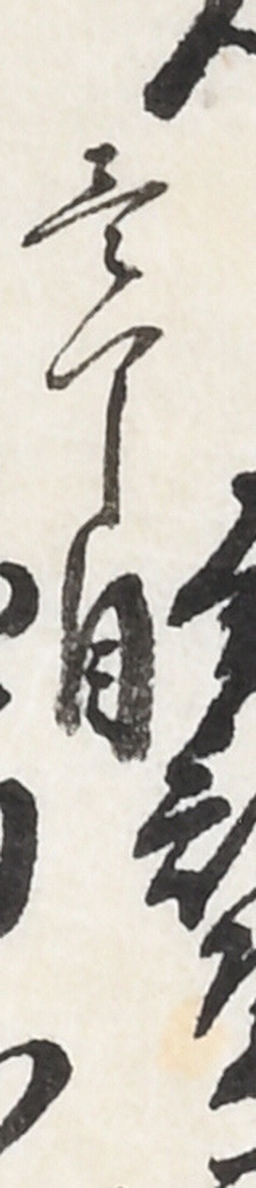壱丁目
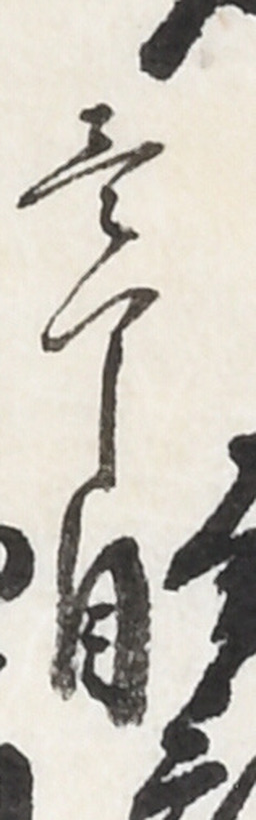壱丁目
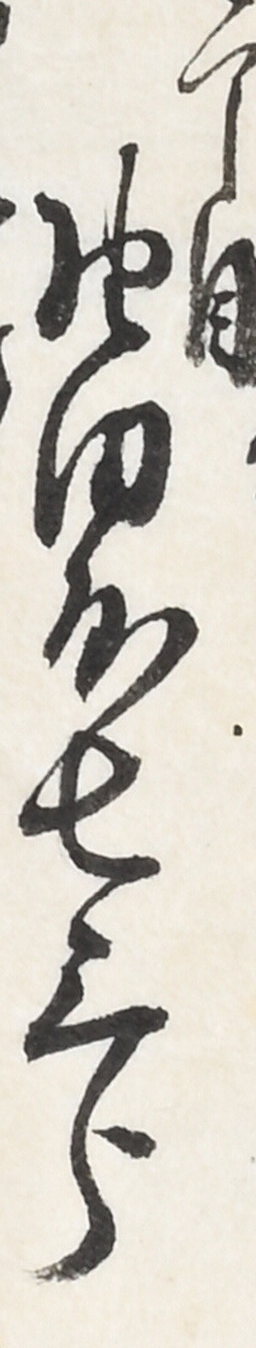野田屋七三郎
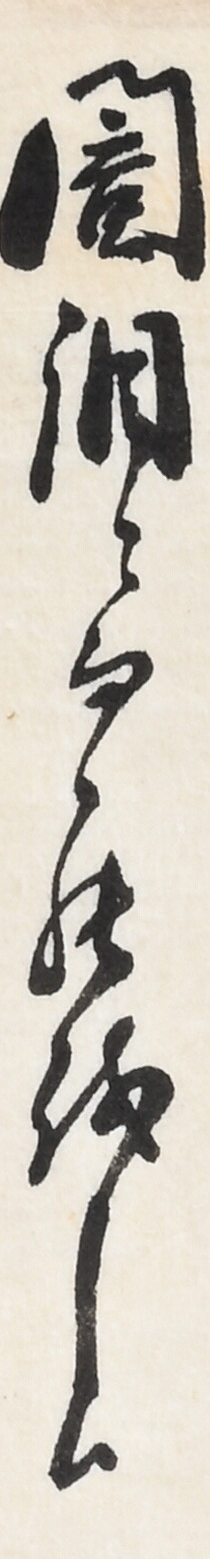関調ニ而罷越申候
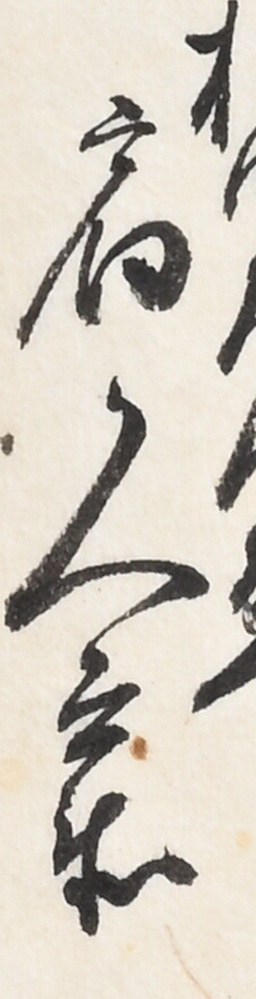宿久兵衛
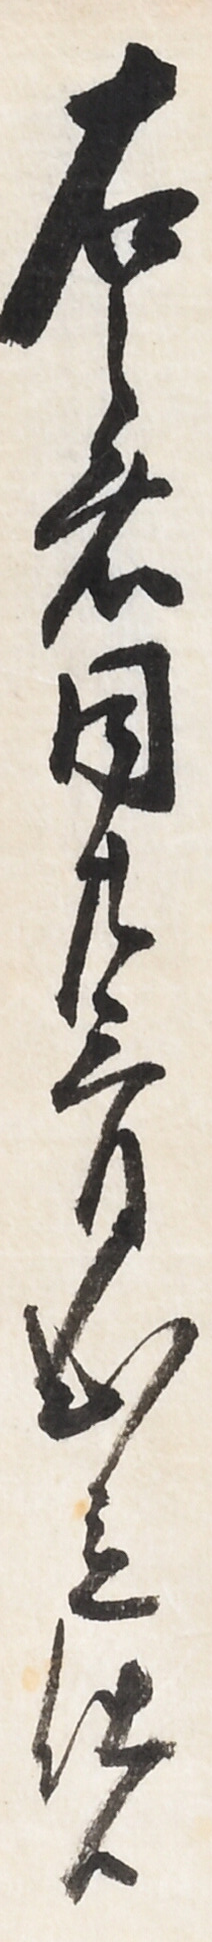右之者同廿三日出立仕候
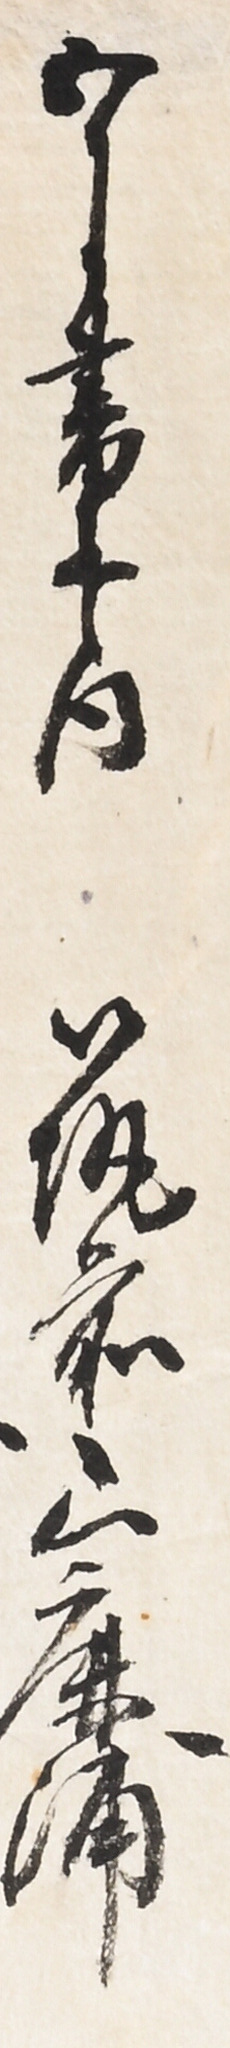五月書上之内筑前山鹿浦
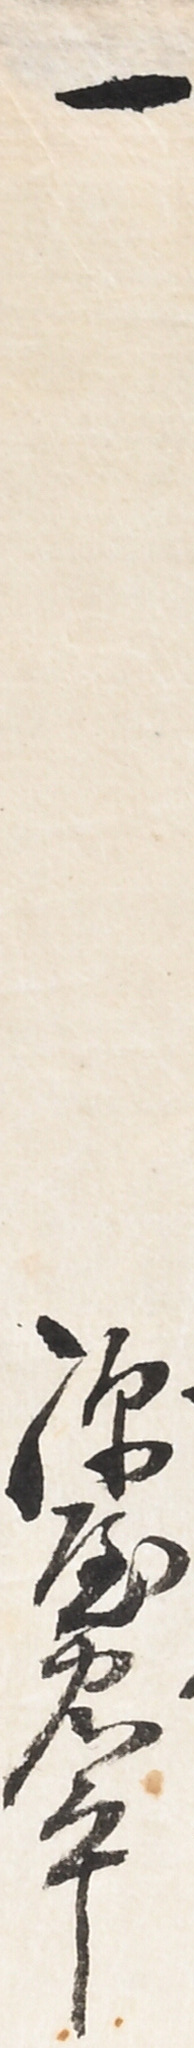一綿屋忠平
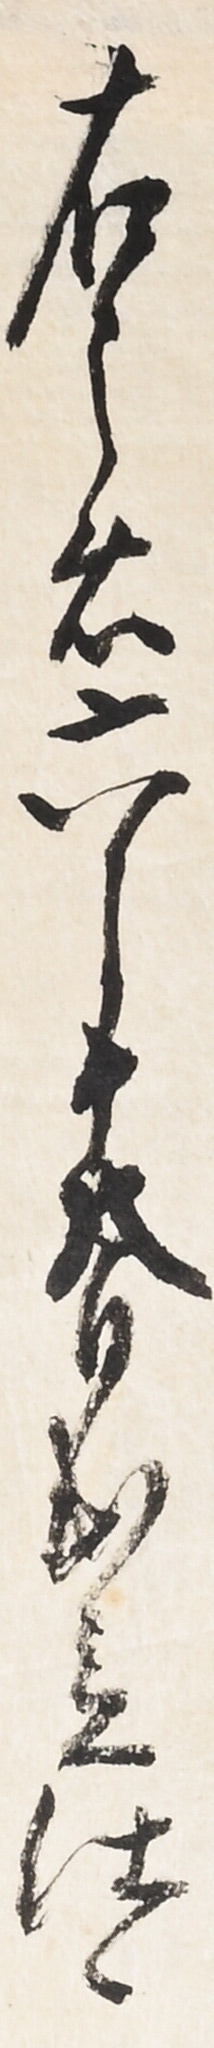右之者六月十八日出立仕候
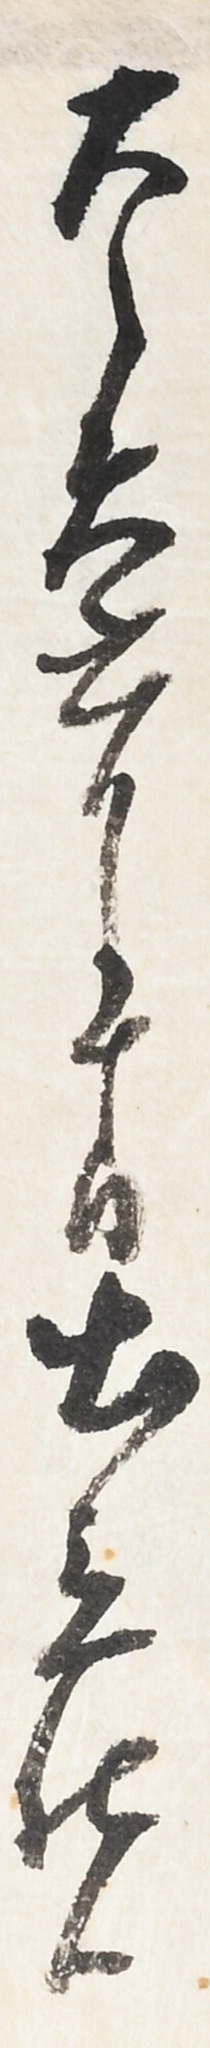右之者六月十日出立仕候
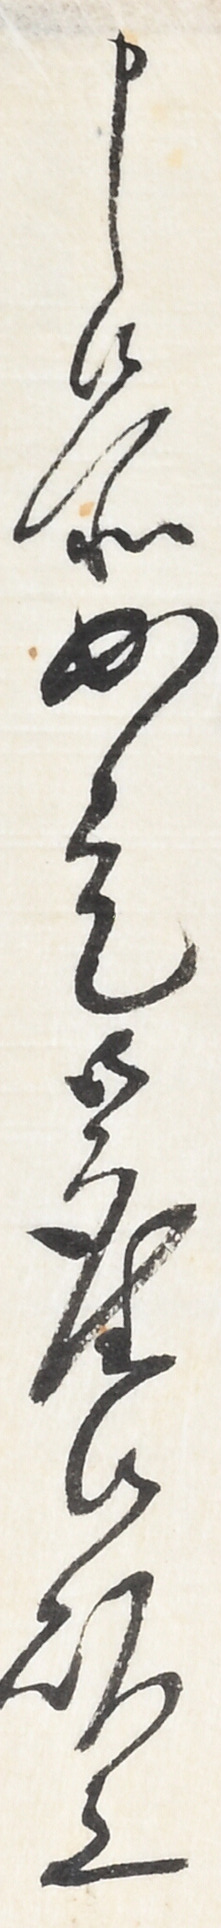申候所如是御座候以上
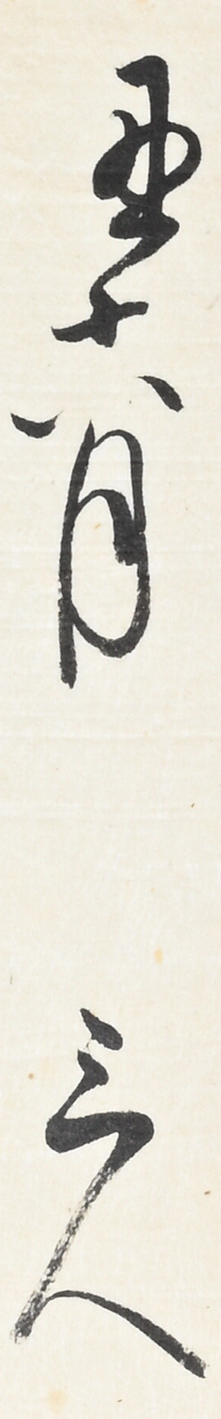丑六月三人

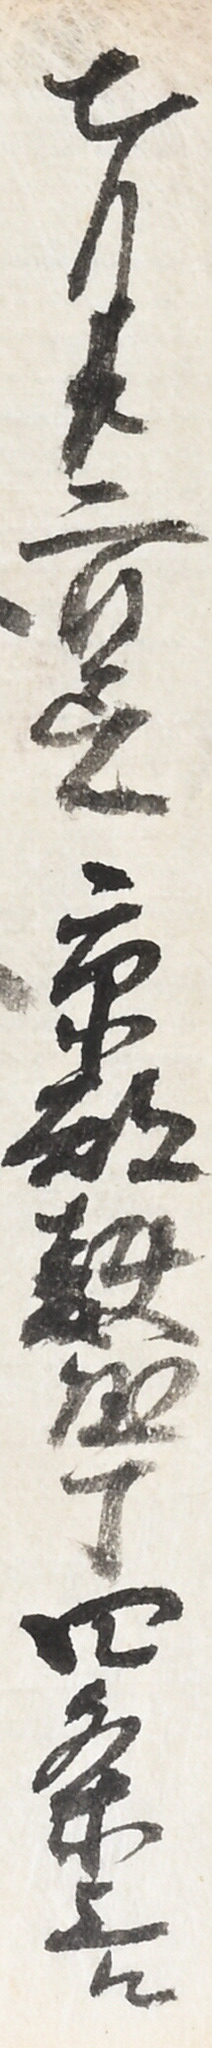七月廿二日着京都麩屋丁四条上ル
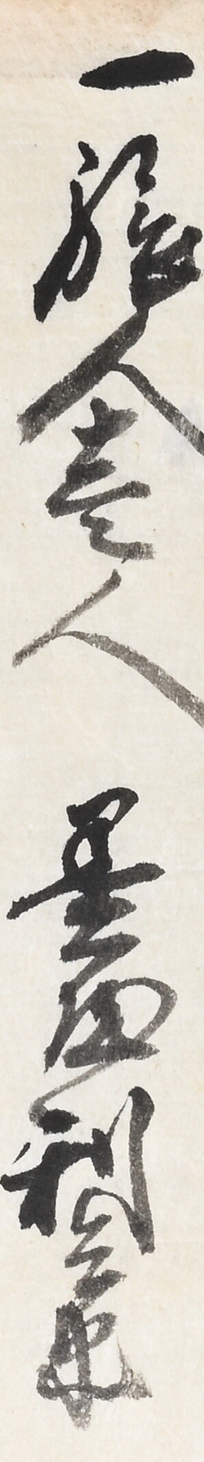一旅人壱人墨屋利兵衛
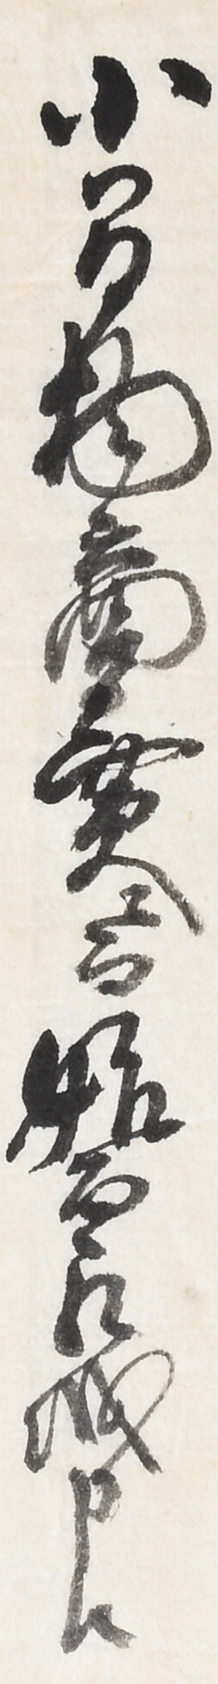小間物商売ニ而始而罷越申候
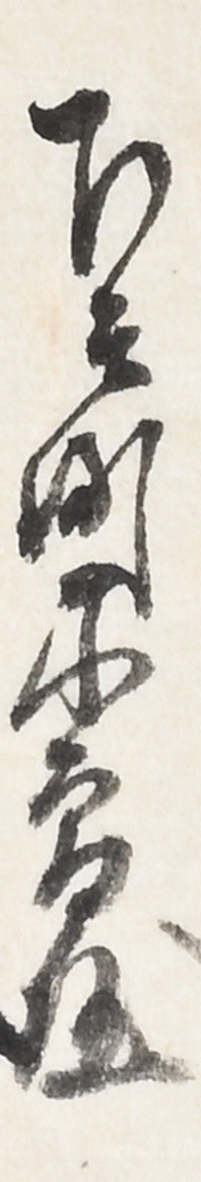下モ町木曽屋
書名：旅人泊控帳
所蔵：伊那市立高遠町図書館・合同会社AMANE
